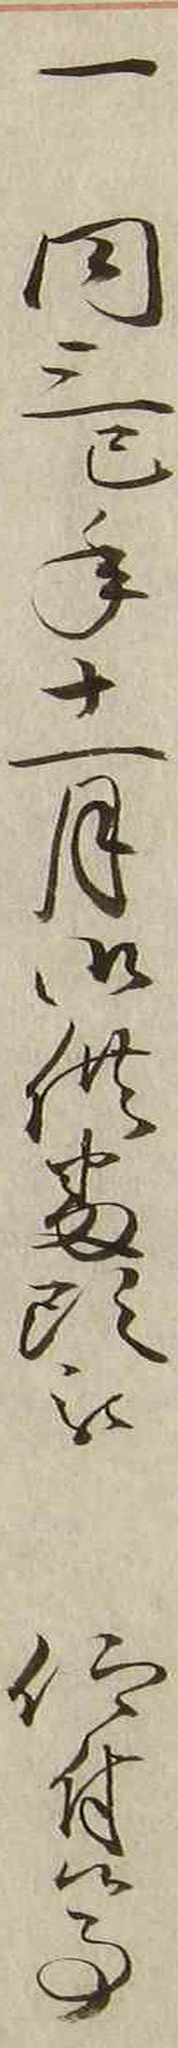一同三巳年十一月御供番頭被仰付候事
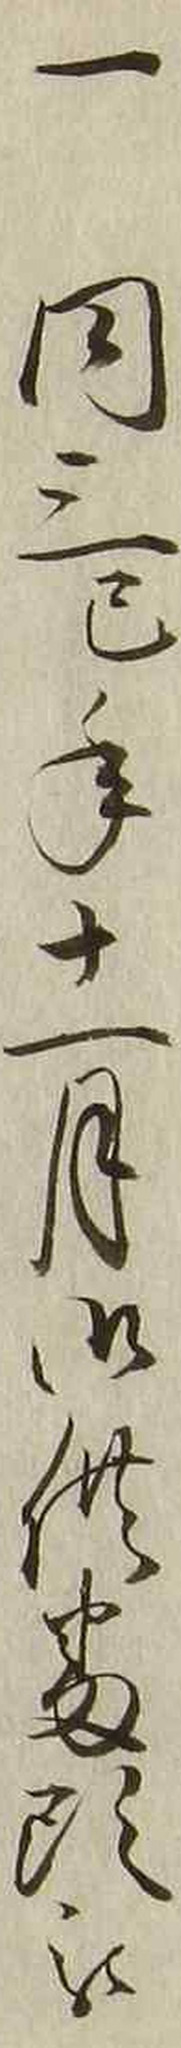一同三巳年十一月御供番頭被仰付候事
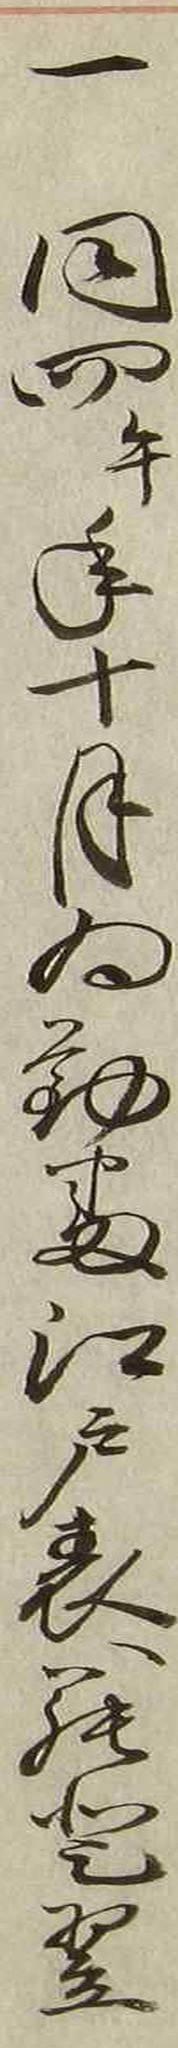一同四午年十月為勤番江戸表へ罷登翌
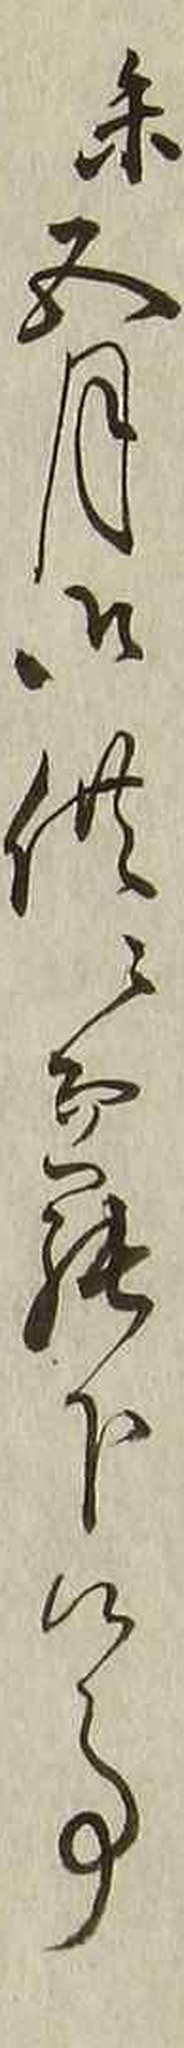未五月御供ニ而罷下候事
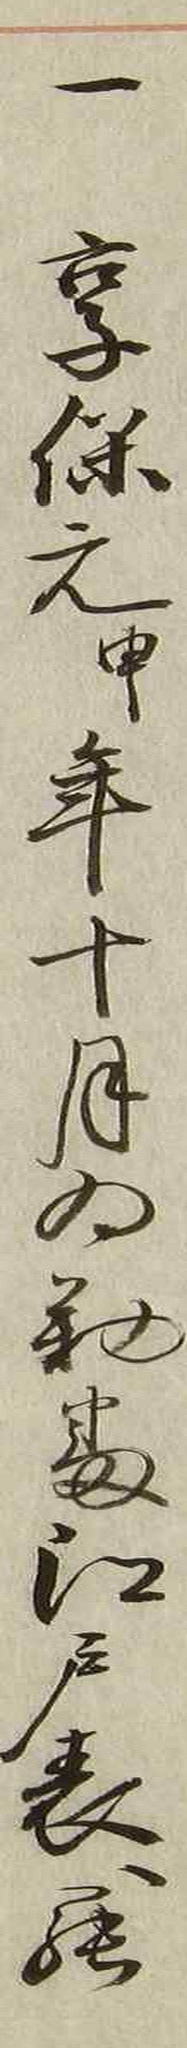一享保元申年十月為勤番江戸表へ罷
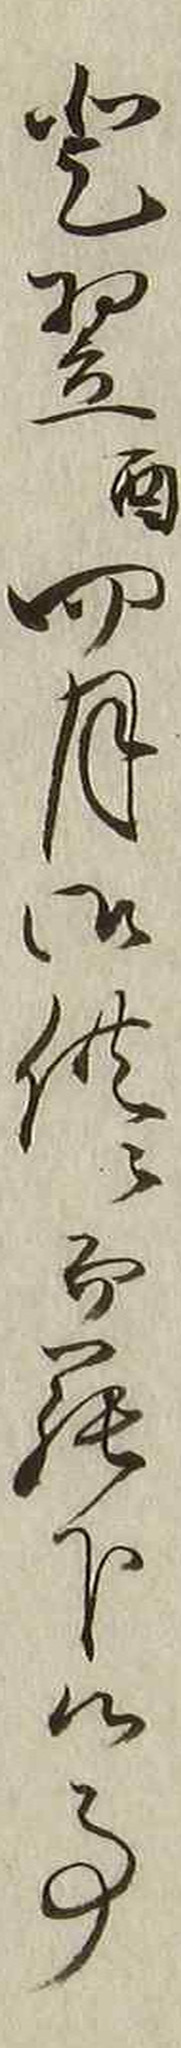登翌酉四月御供ニ而罷下候事
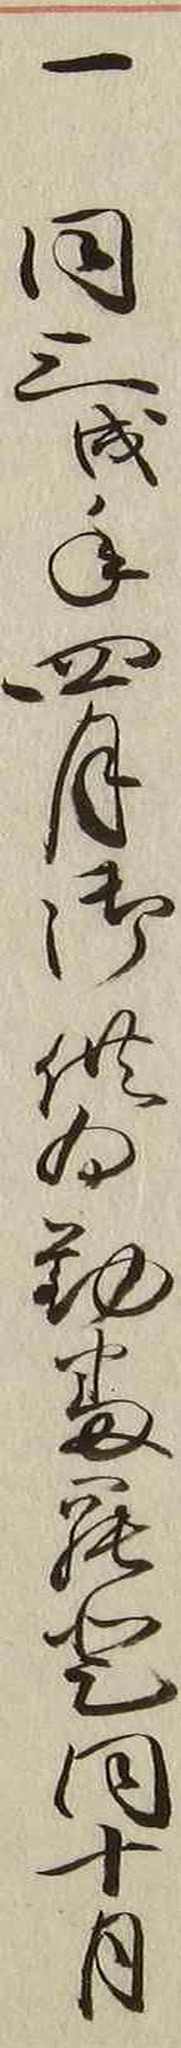一同三戌年四月御供為勤番罷登同十月
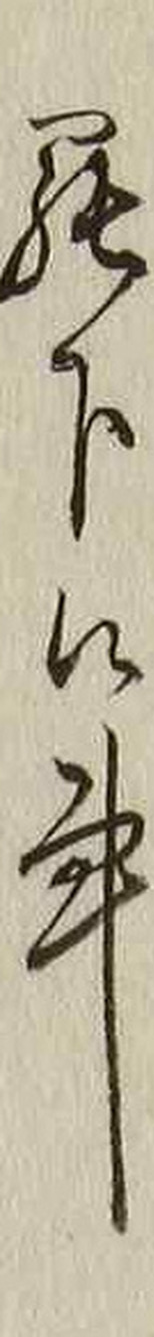罷下候事
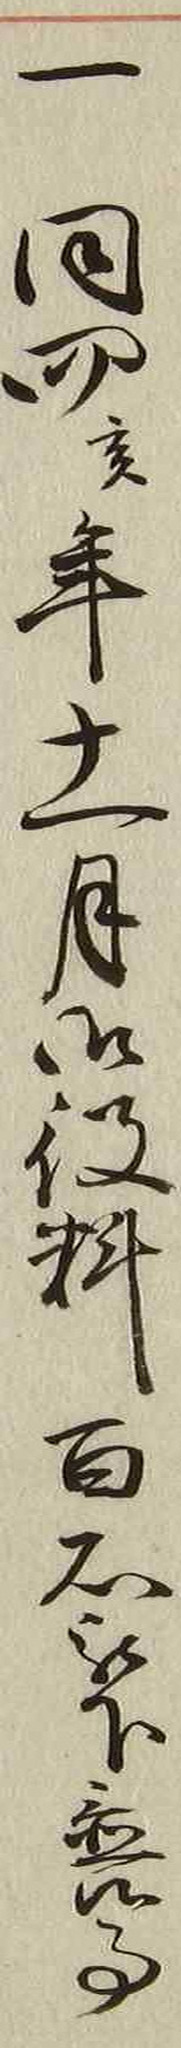一同四亥年十一月御役料百石被下置候事
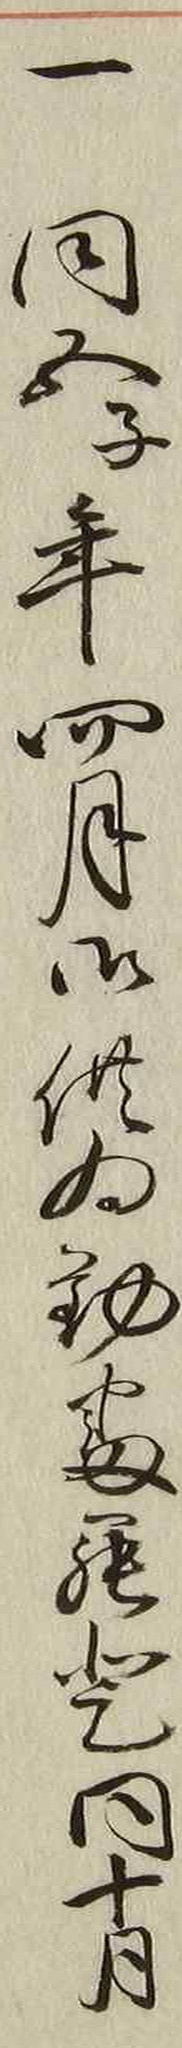一同五子年四月御供為勤番罷登同十月
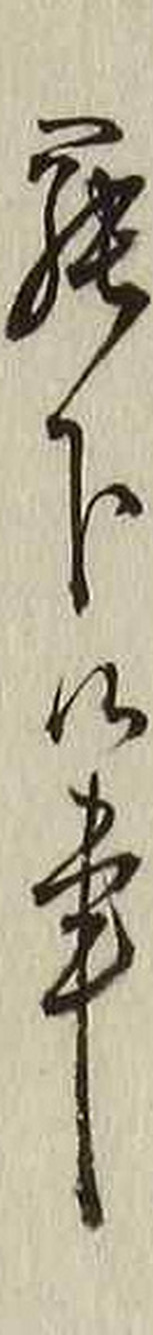罷下候事
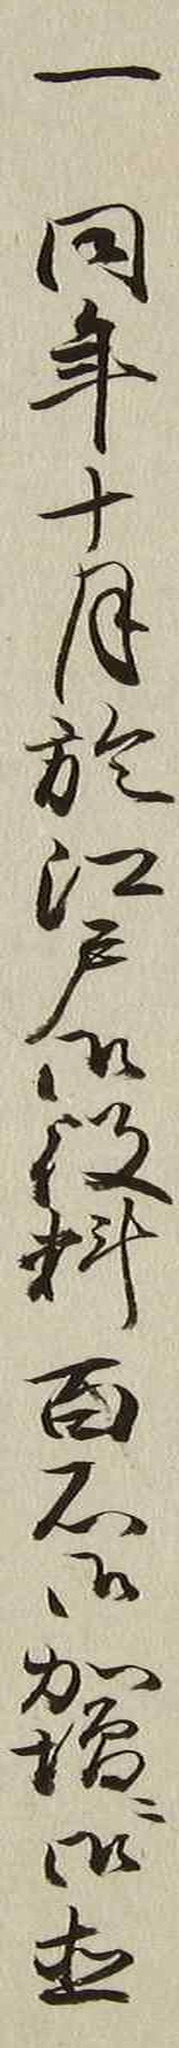一同年十月於江戸御役料百石御加増ニ御直
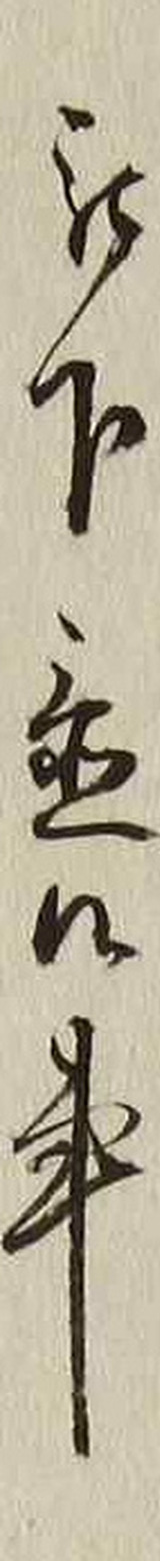被下置候事
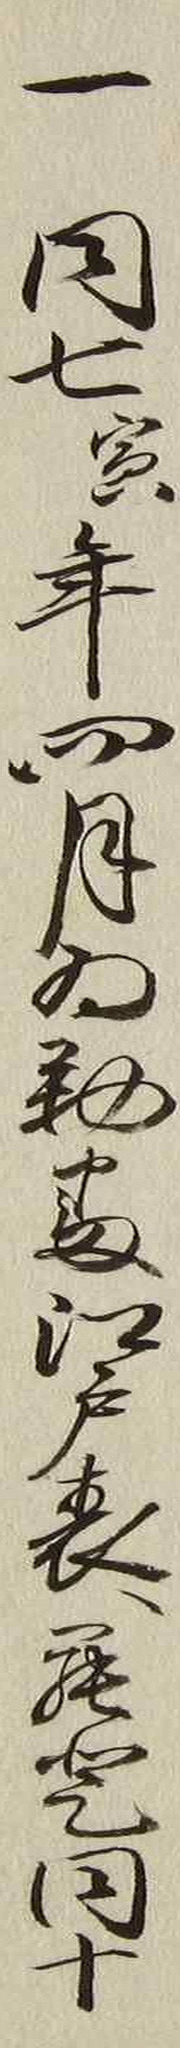一同七寅年四月為勤番江戸表へ罷登同十
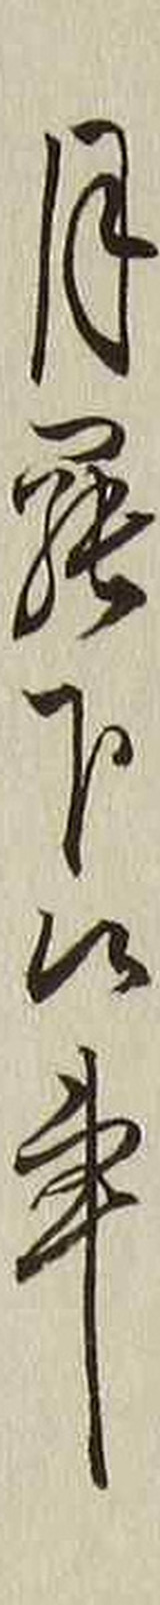月罷下候事
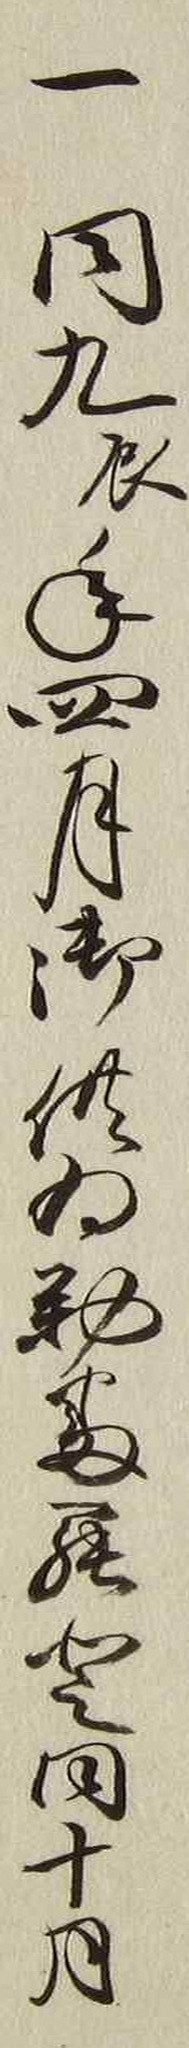一同九辰年四月御供為勤番罷登同十月
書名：諸士系譜　巻之21　い之部21
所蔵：会津若松市立会津図書館
